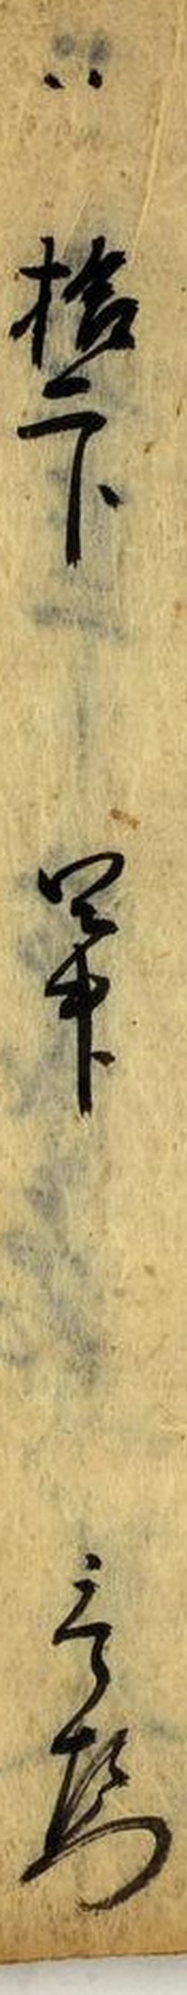同拾二分四升三郎左衛門
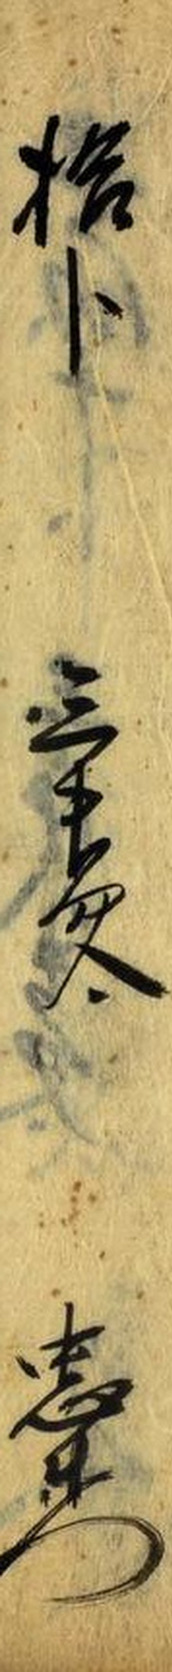同拾分三升四合忠右衛門
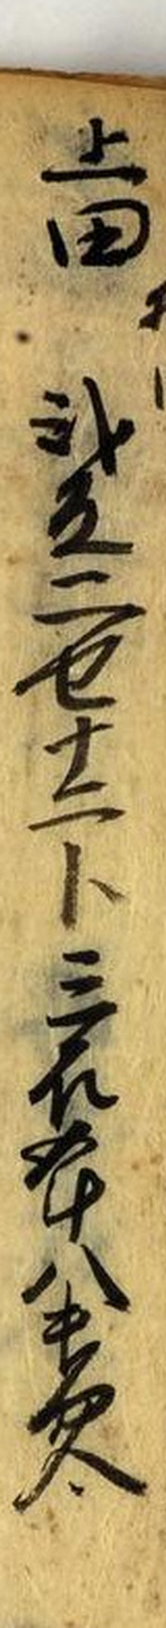上田弐反二セ十二分三石五斗八升四合藤四郎
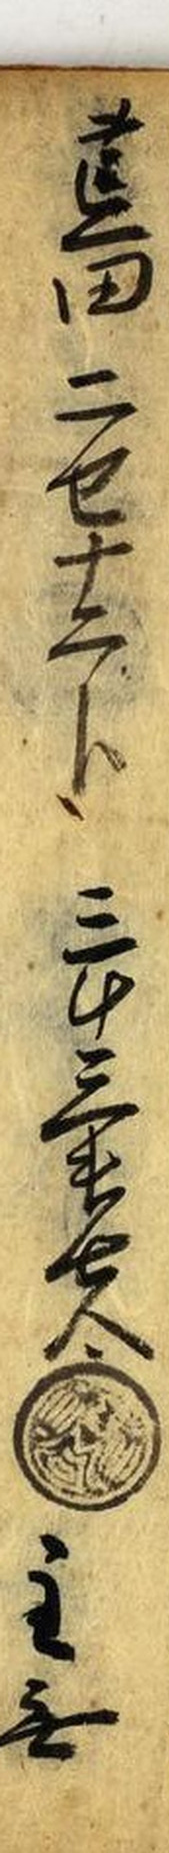荒田二セ十二分三斗三升七合㊞主無
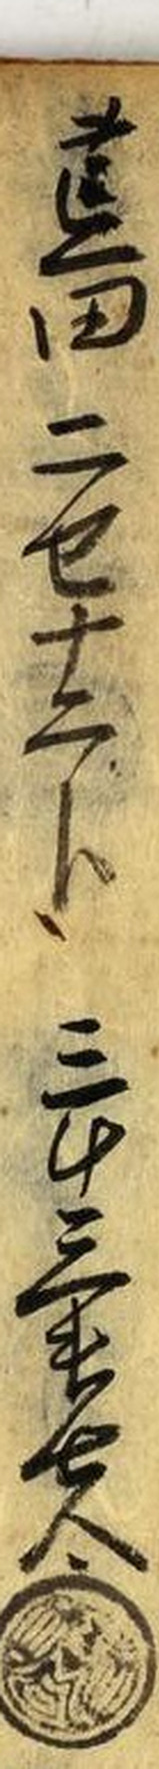荒田二セ十二分三斗三升七合㊞主無
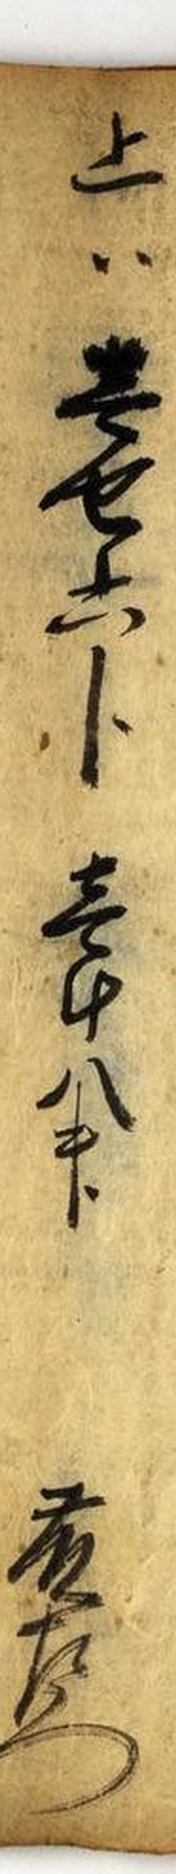上同壱セ六分壱斗八升藤左衛門

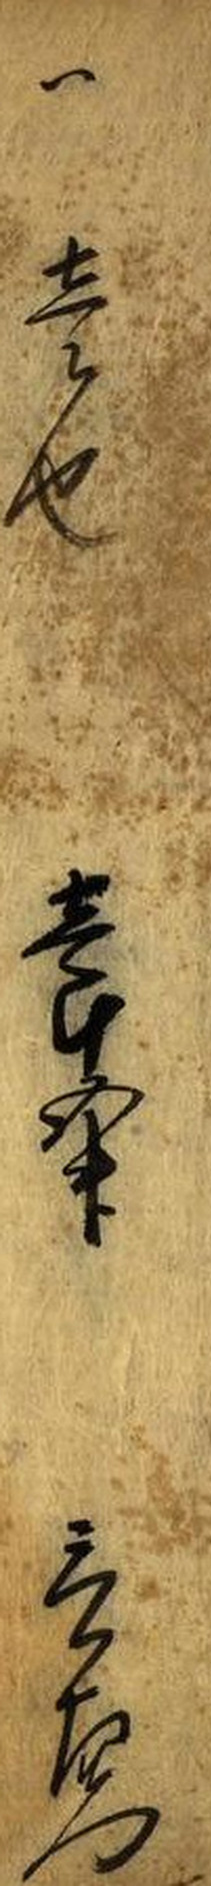同壱セ壱斗五升三郎左衛門
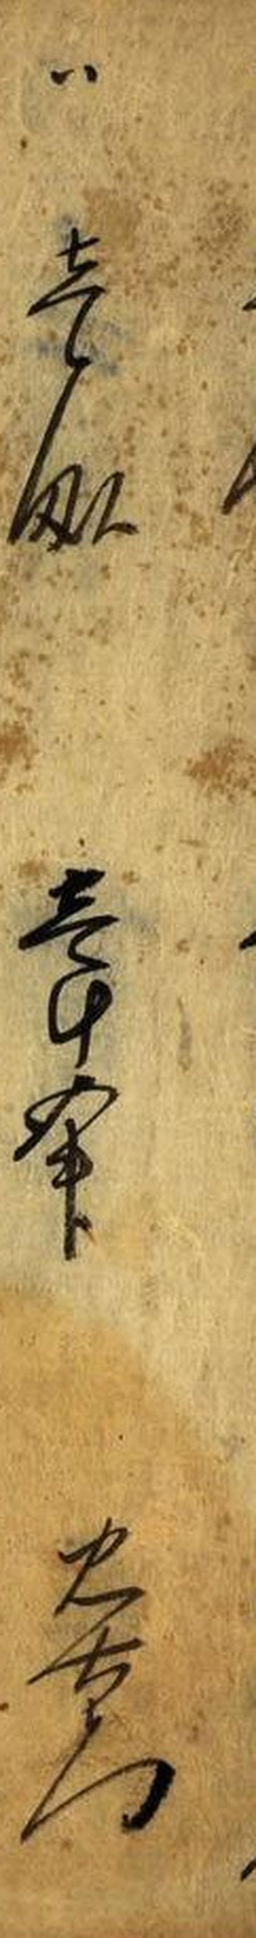同壱畝壱斗五升忠右衛門
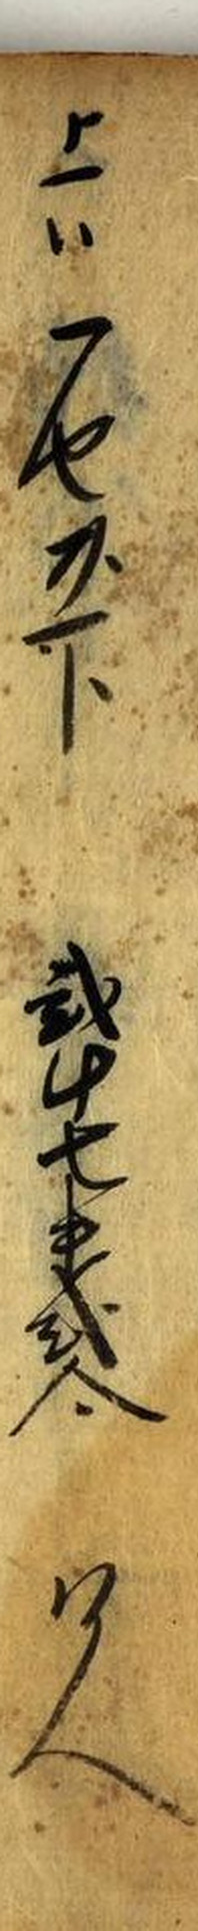上同一セ廿一分弐斗七升弐合同人
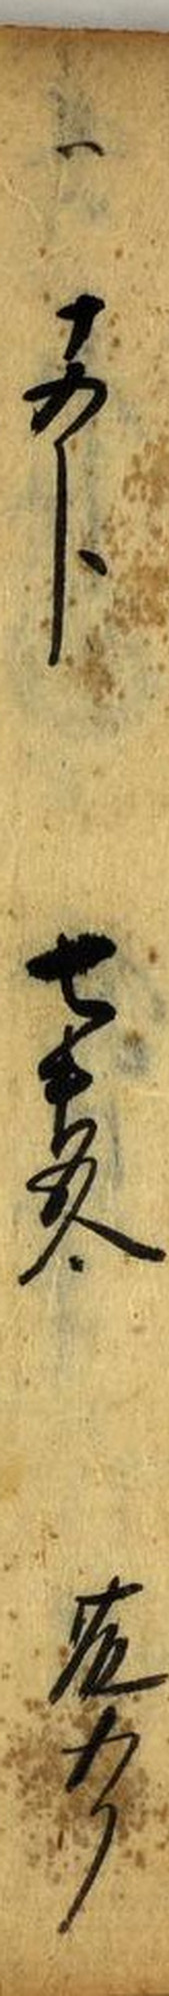同十五分七升五合藤九郎
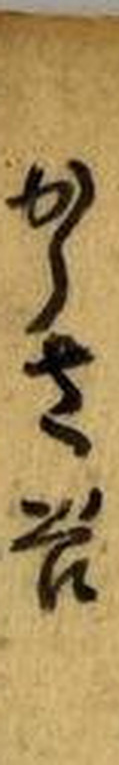からさ谷
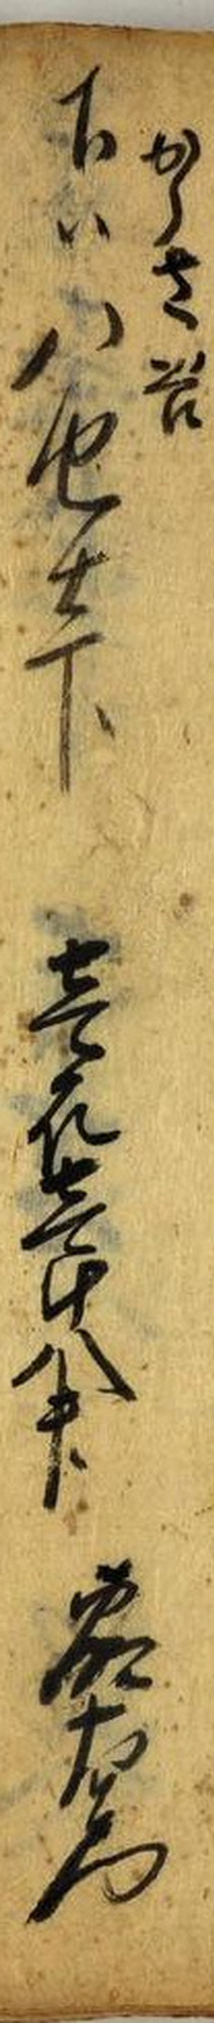下同八セ十一分壱石壱斗八升藤左衛門
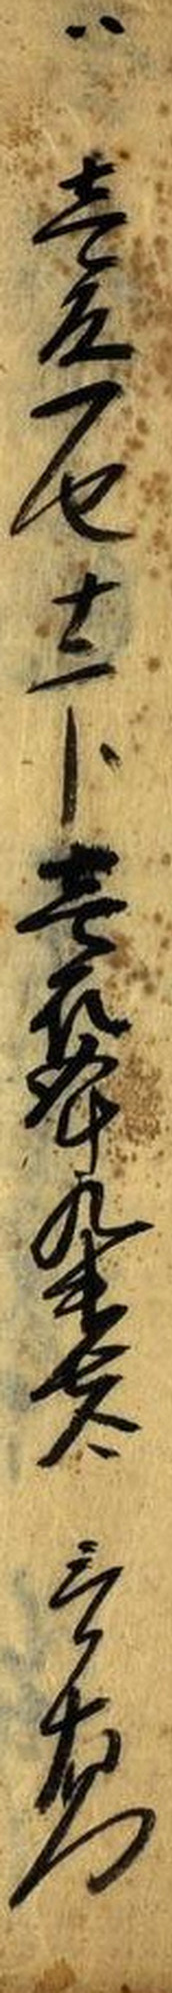同壱反一セ十二分壱石五斗九升五合三郎左衛門
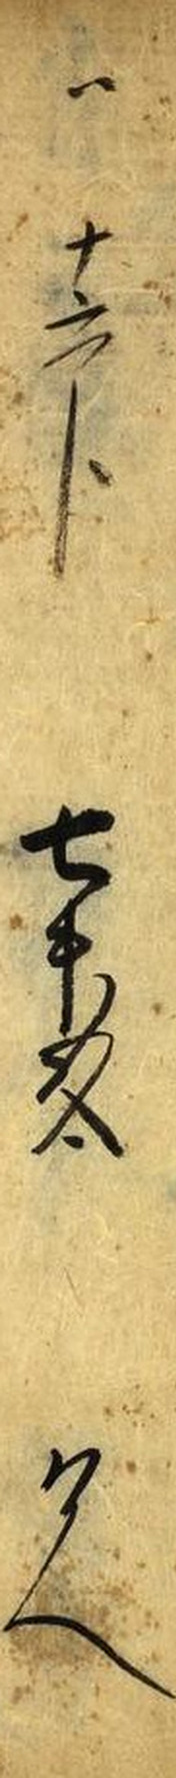同十六分七升五合同人
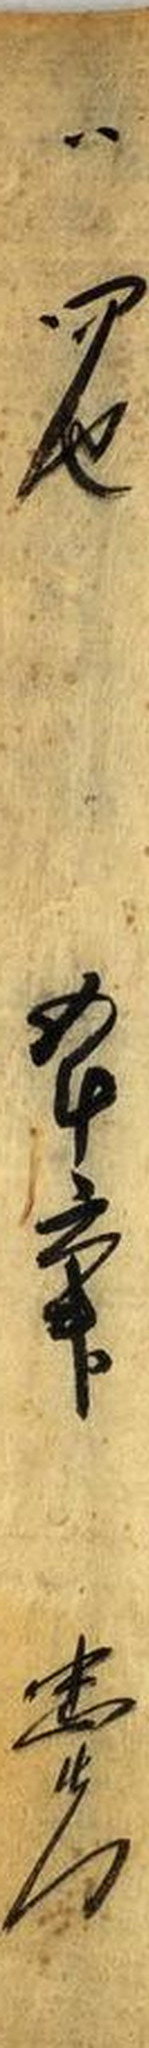同四セ五斗六升忠右衛門
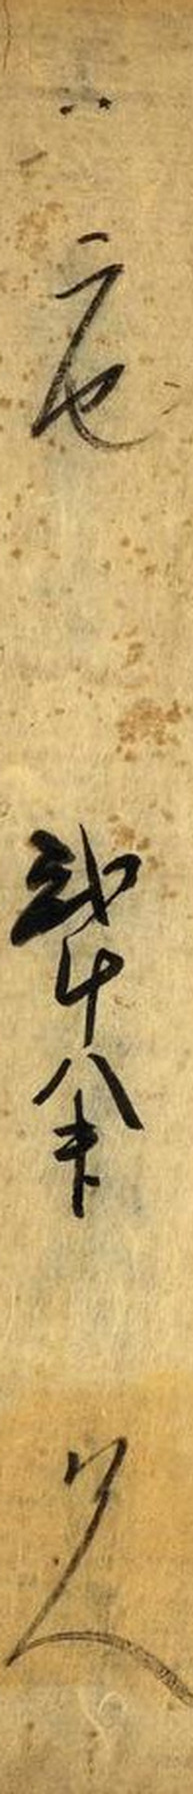同二セ弐斗八升同人
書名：越前国西方内志津庄内本折村御検地帳
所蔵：福井県文書館 Fukui Prefectural Archives
